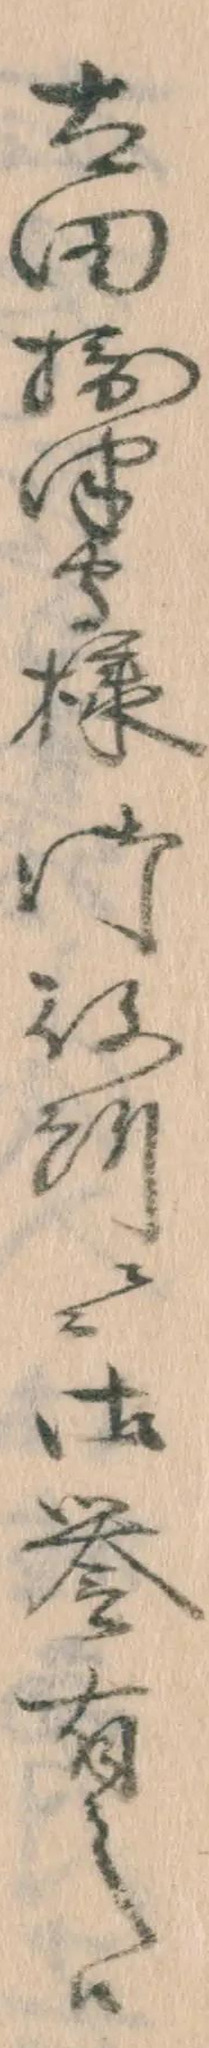太田摂津守様御役所ニ而御誉有之候
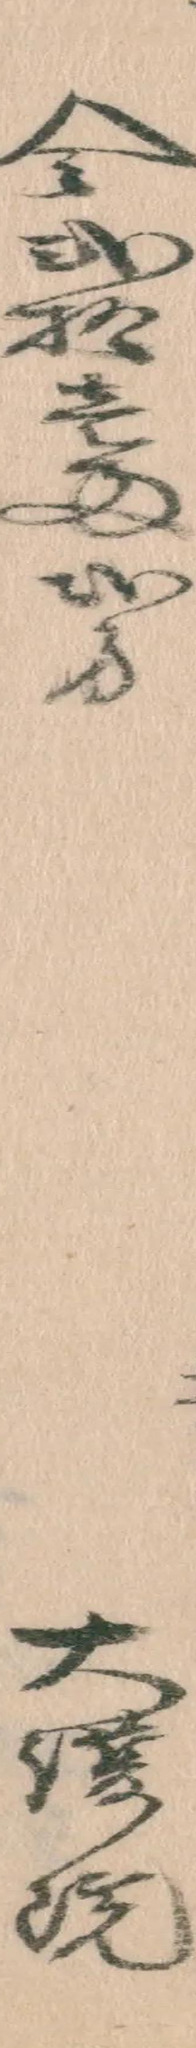一金弐拾壱両弐分大護院
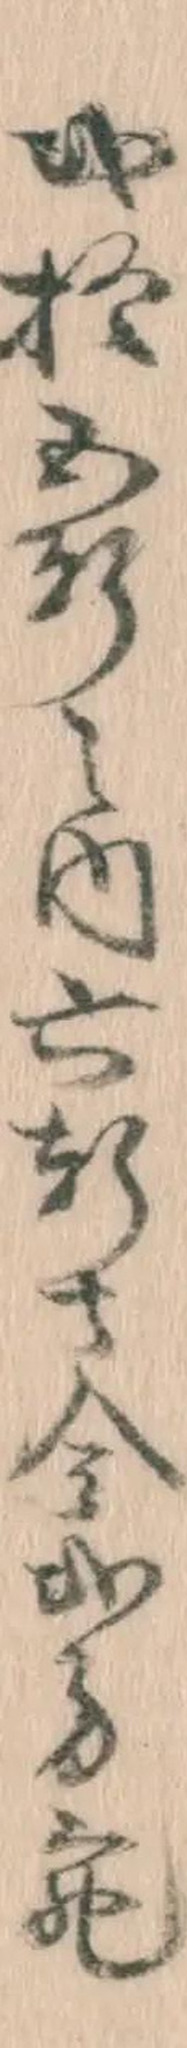弐拾五軒之内六軒は金弐分宛右門前
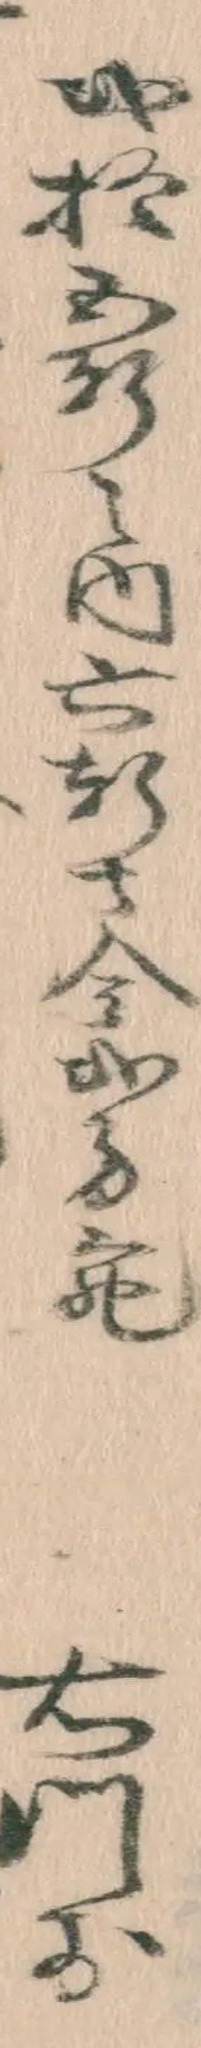弐拾五軒之内六軒は金弐分宛右門前
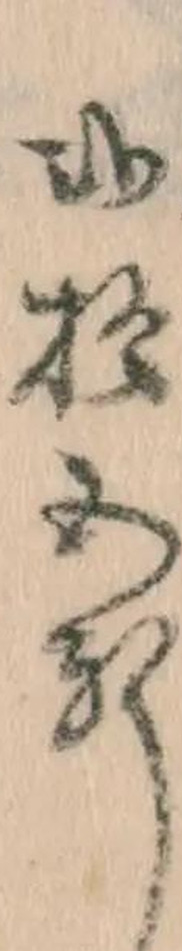弐拾弐軒
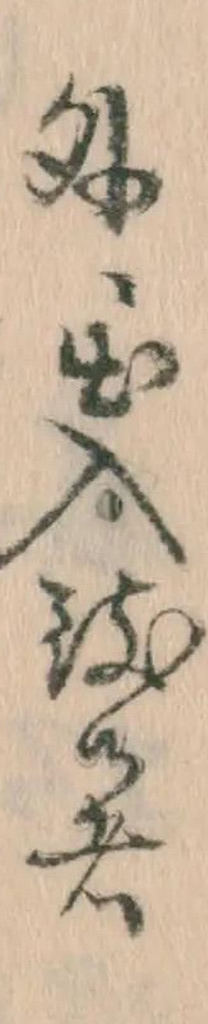外ニ出入致候者
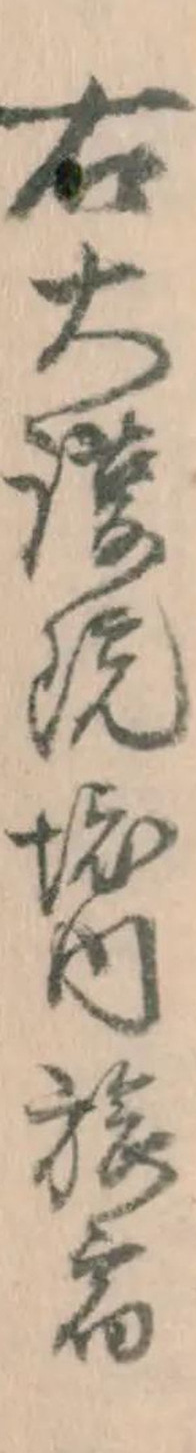右大護院境内旅宿
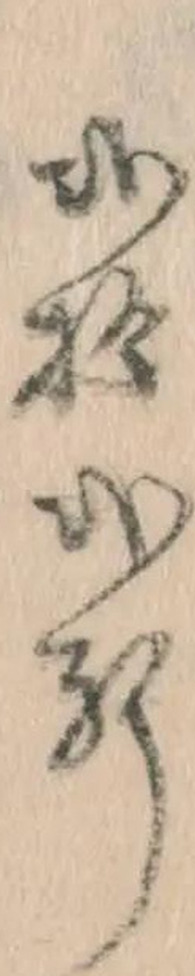弐拾弐軒
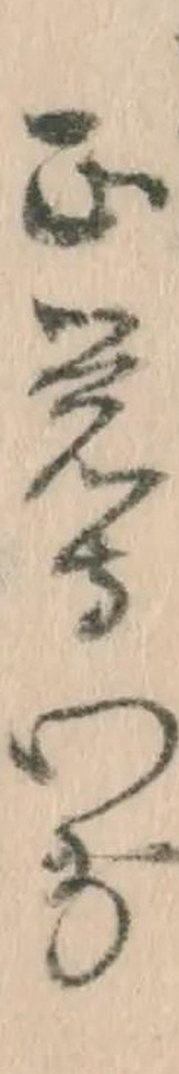正覚寺門前
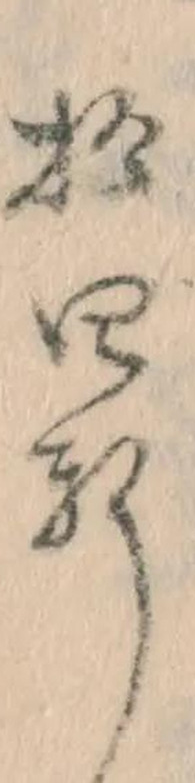拾四軒
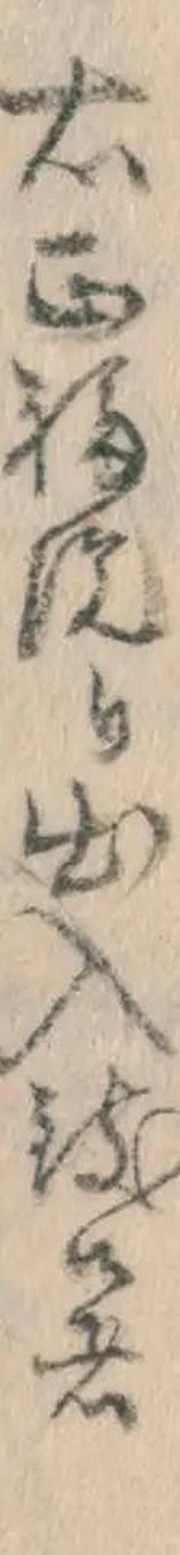右正福院え出入致候者
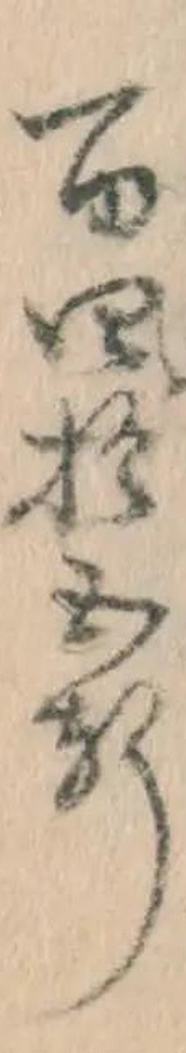百四拾五軒

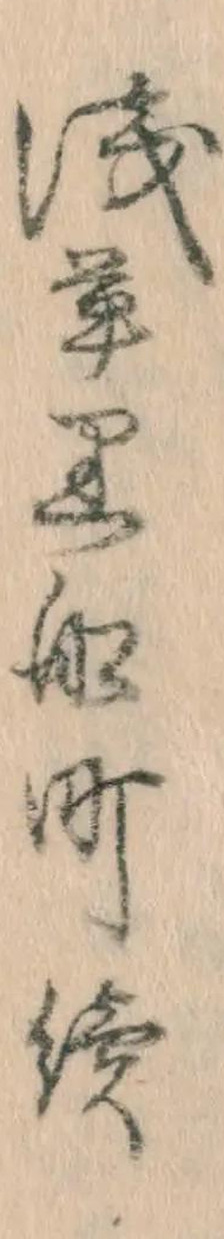浅草黒船町続
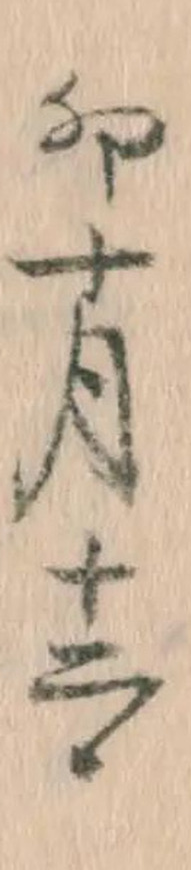卯十月十二日
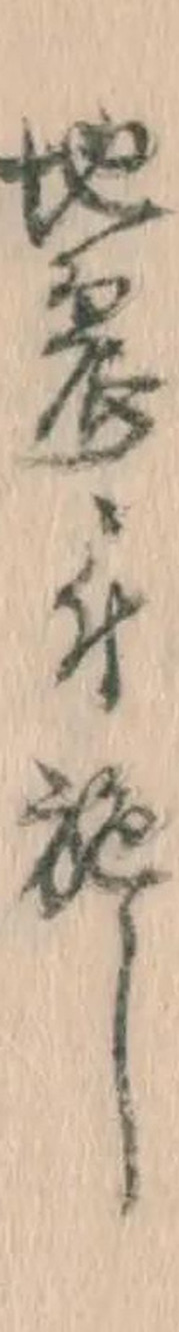地震ニ付施し
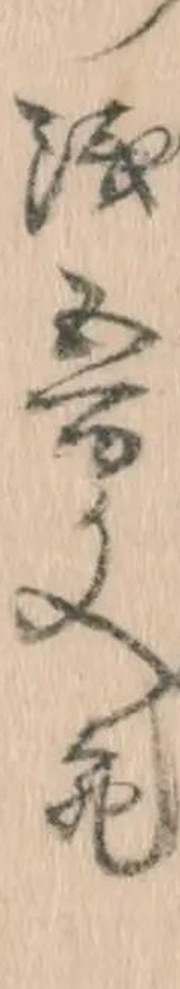銭五貫文宛
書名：武家方并寺院等ニテ施差出候一件
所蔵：国立国会図書館 National Diet Library, JAPAN
